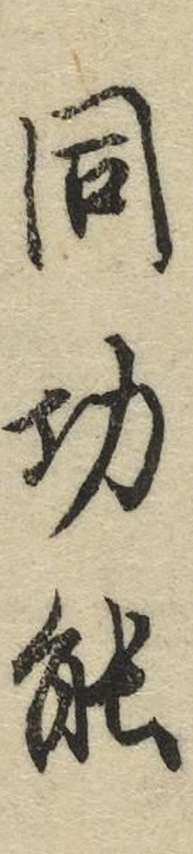同功能
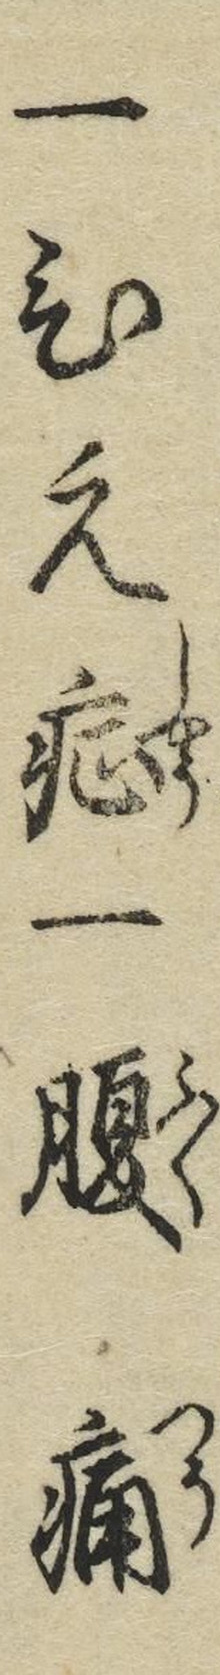一ひえ症一腹痛
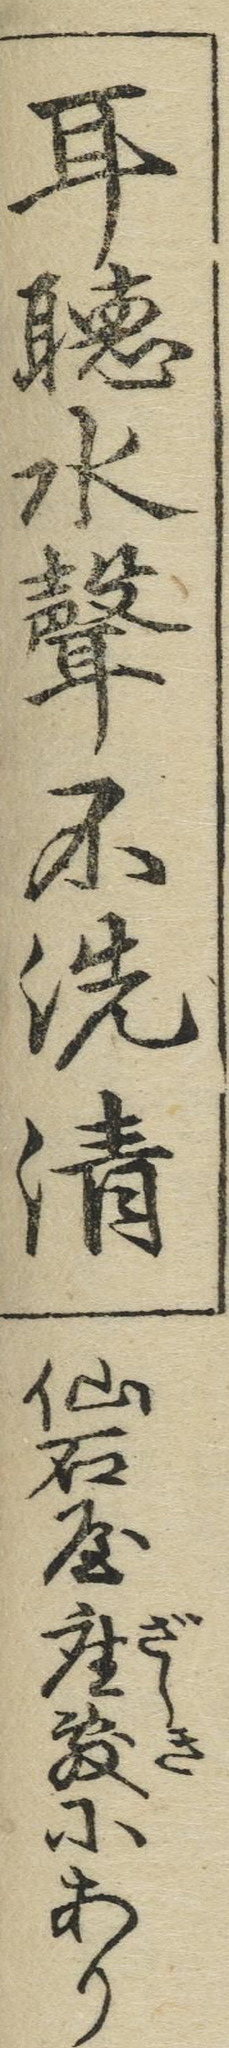耳聴水聲不洗清
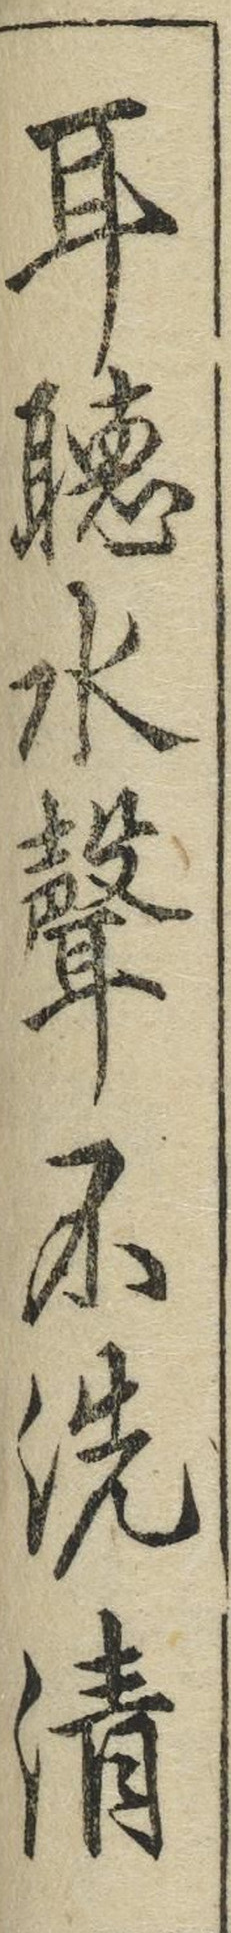耳聴水聲不洗清
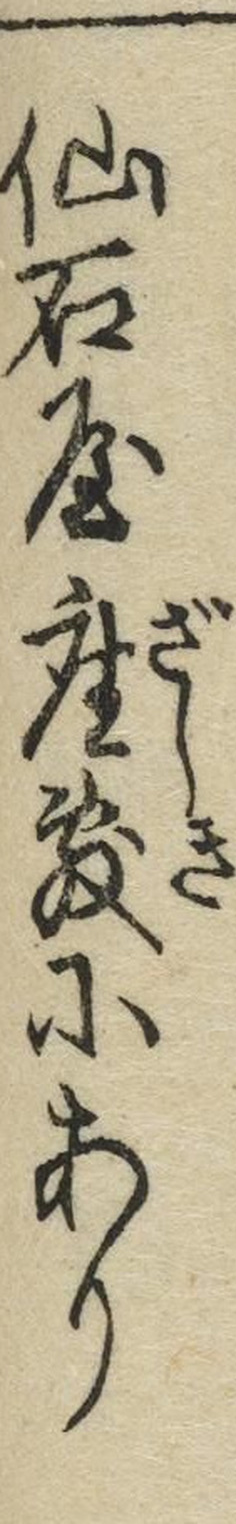仙石屋座敷にあり
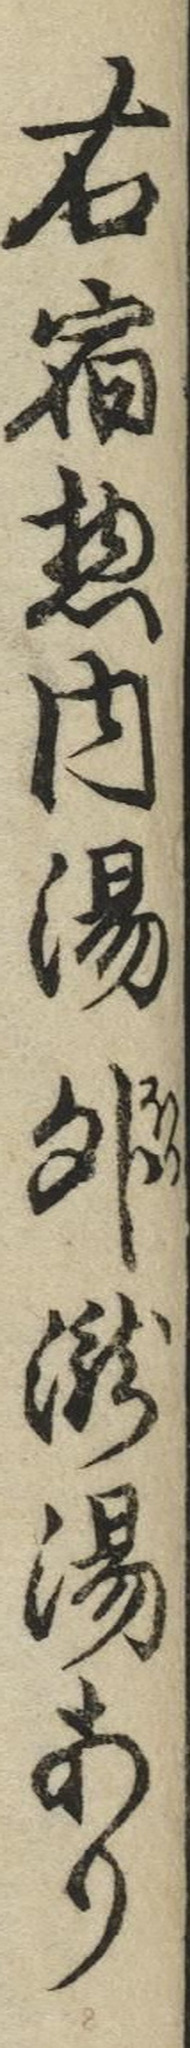右宿惣内湯外瀧湯あり
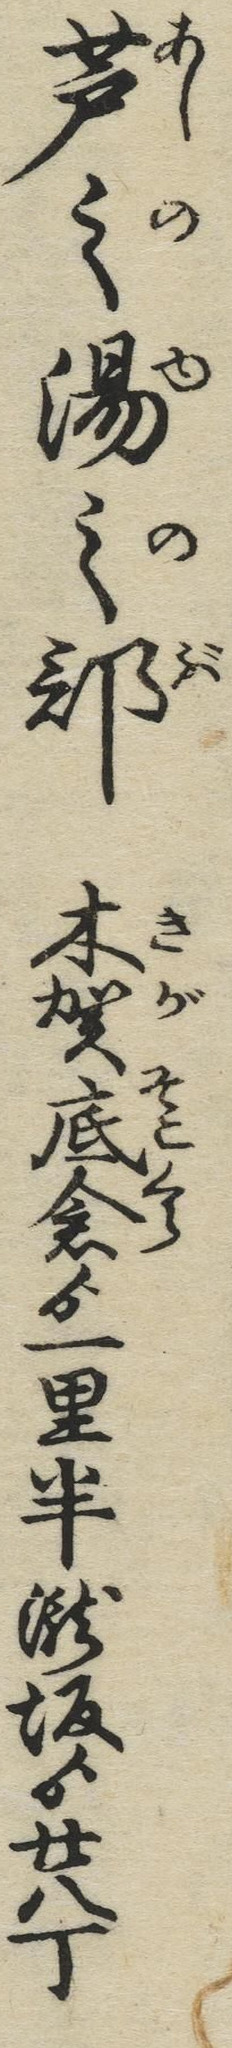芦之湯之部木賀より一里半瀧坂より廿八丁
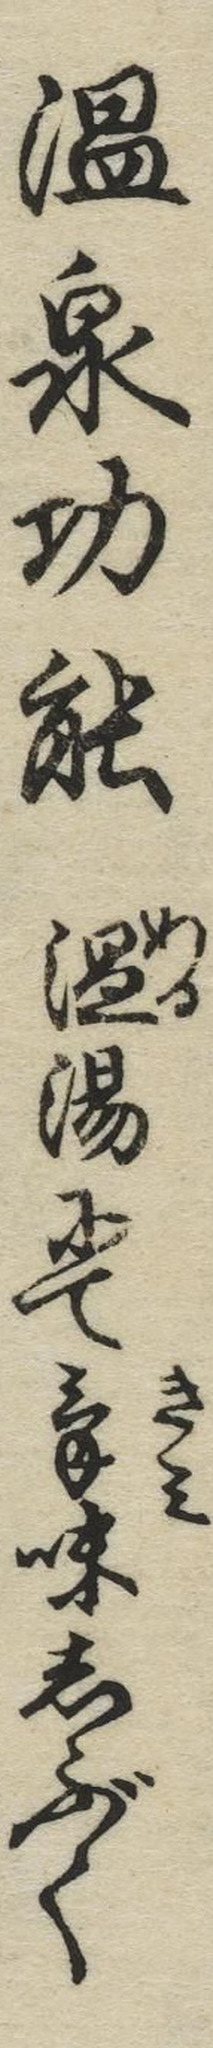温泉功能温湯にて氣味しぶく
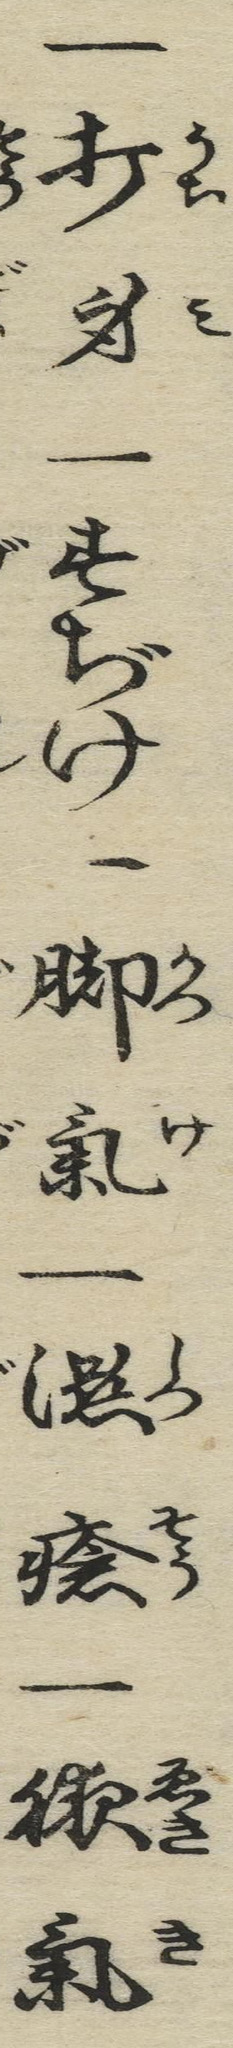一打身一すぢけ一脚氣一湿瘡一腋氣
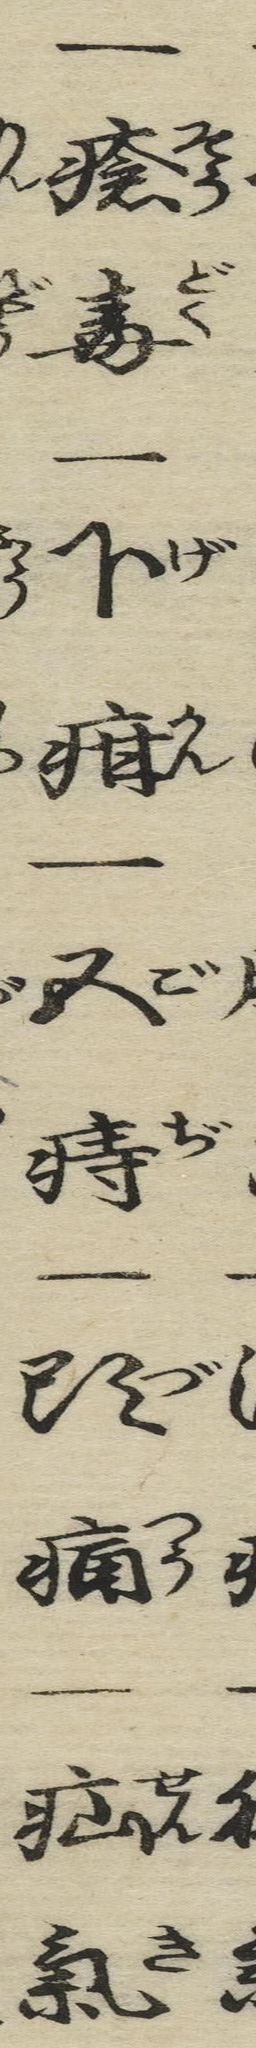一瘡毒一下疳一五痔一頭痛一疝氣
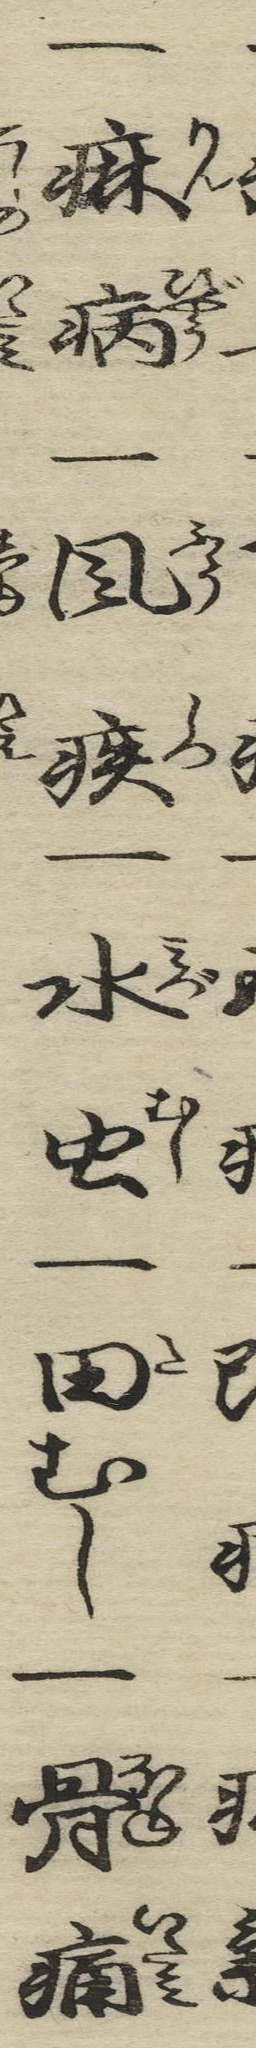一痳病一風疾一水虫一田）むし一骨痛
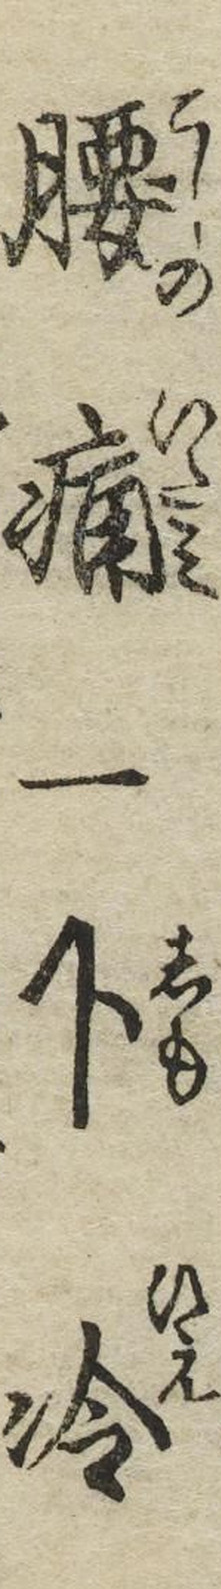腰痛一下冷
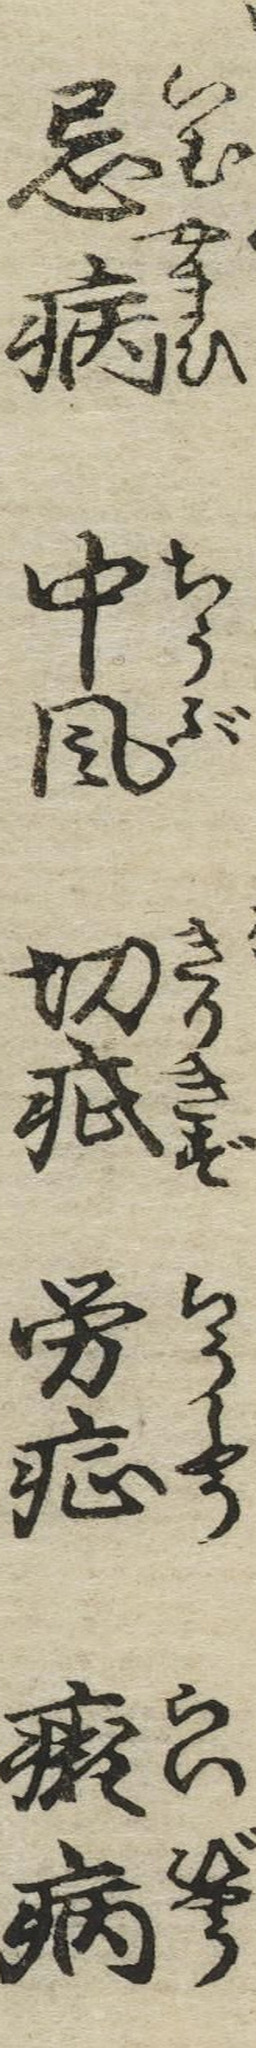忌病中風切疵労症癩病
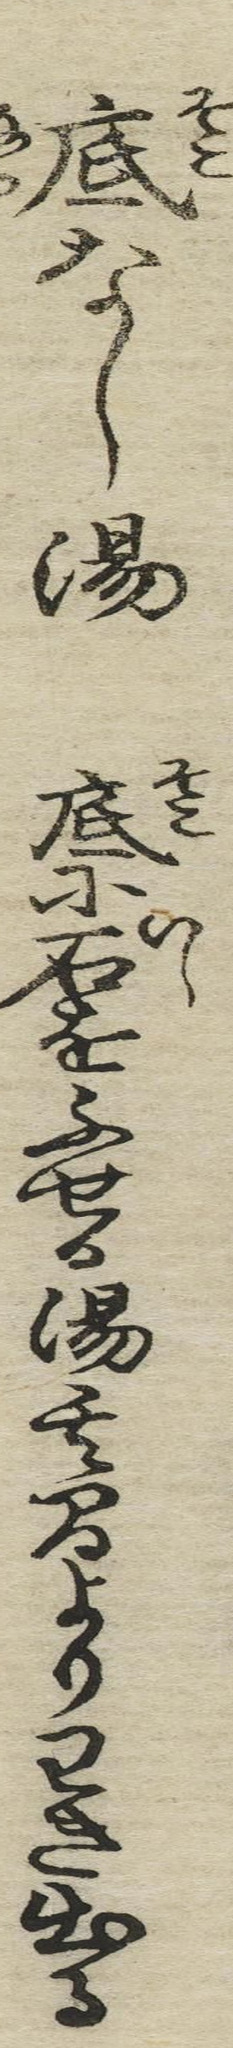一底なし湯底に石をふせる湯其間よりわき出る
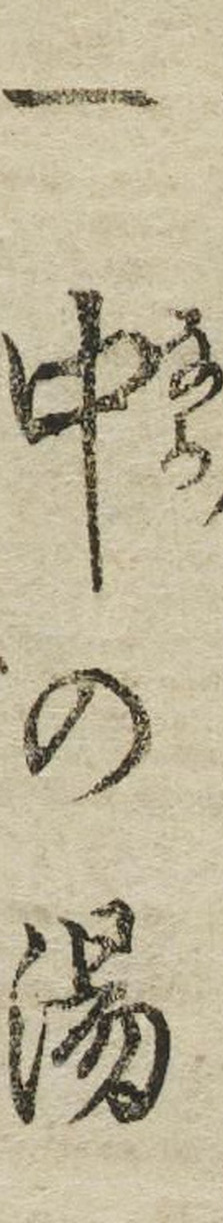一中の湯
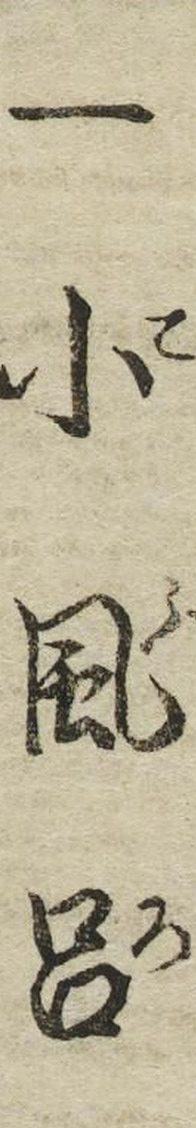一小風呂
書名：箱根七湯　温泉圖會　全
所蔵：東京大学地震研究所図書室 Earthquake Research Institute Library, The University of Tokyo, JAPAN
